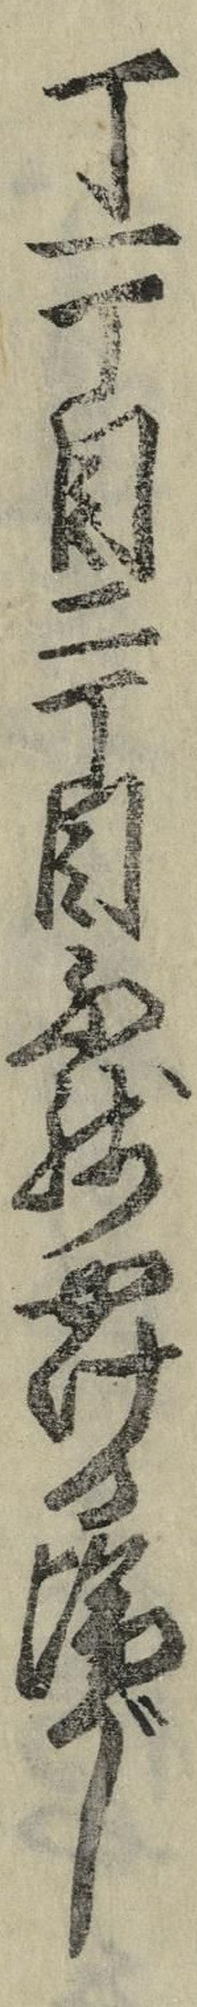丁一丁目二丁目不残やける塩がし
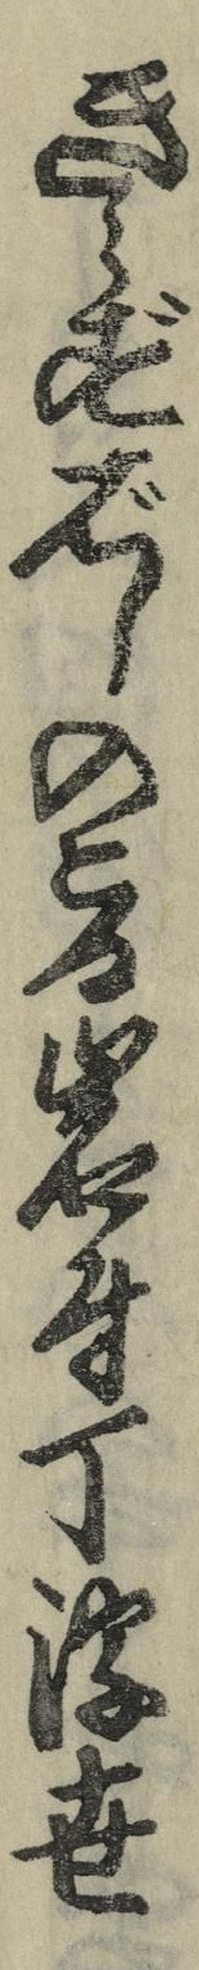きらずばしのこる岩付丁浮世
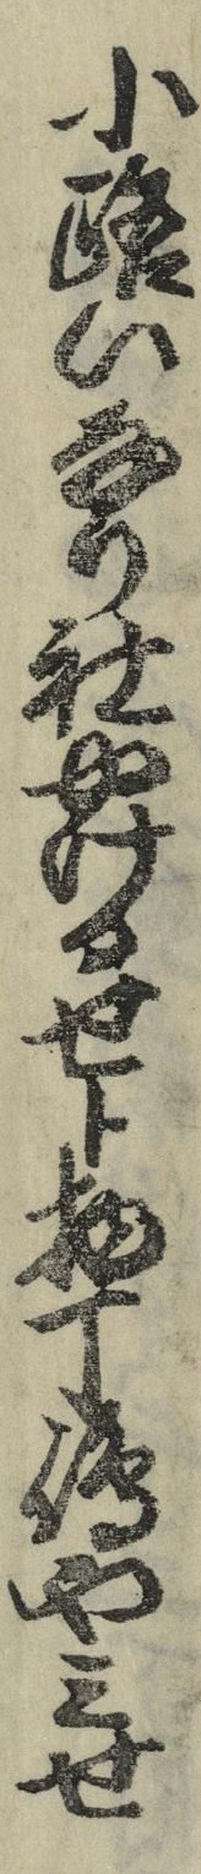小路いなり社やけるせト物丁嶋やみせ
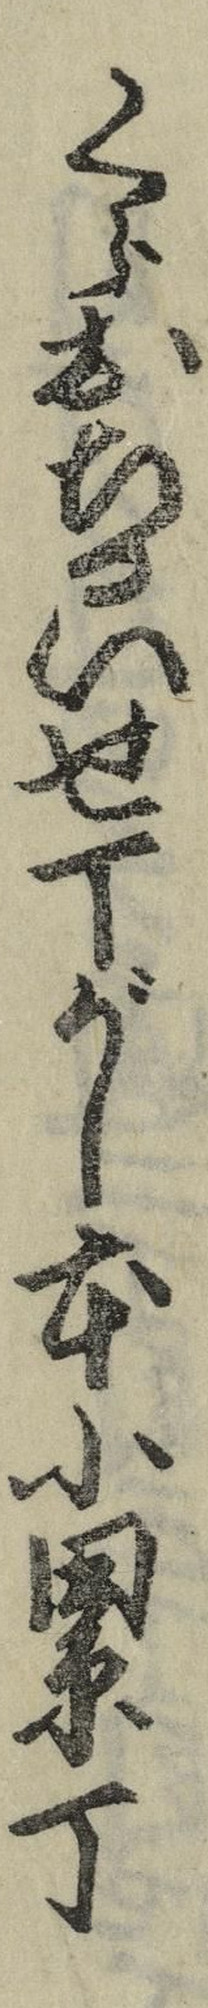くらおちるいせ丁がし本小田原丁
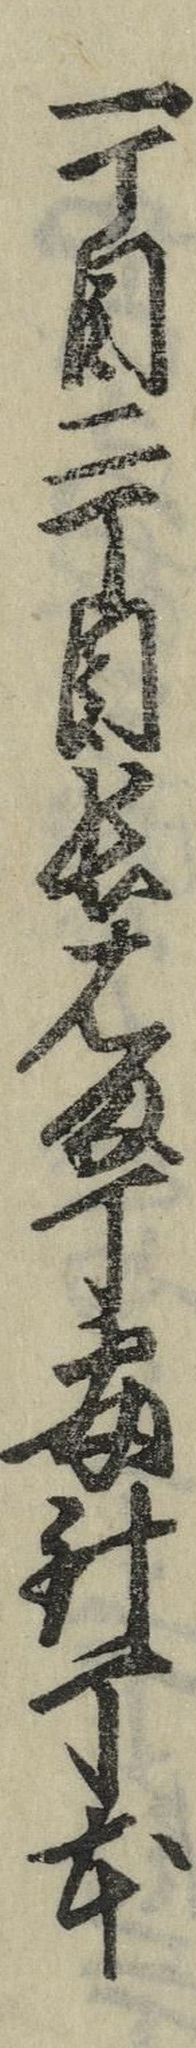一丁目二丁目長はま丁安針丁本
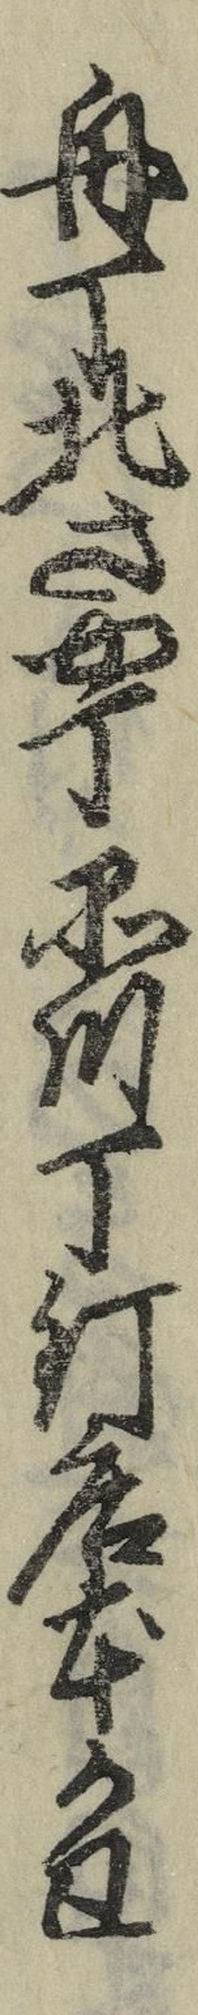舟丁北さや丁品川丁釘店本かわ
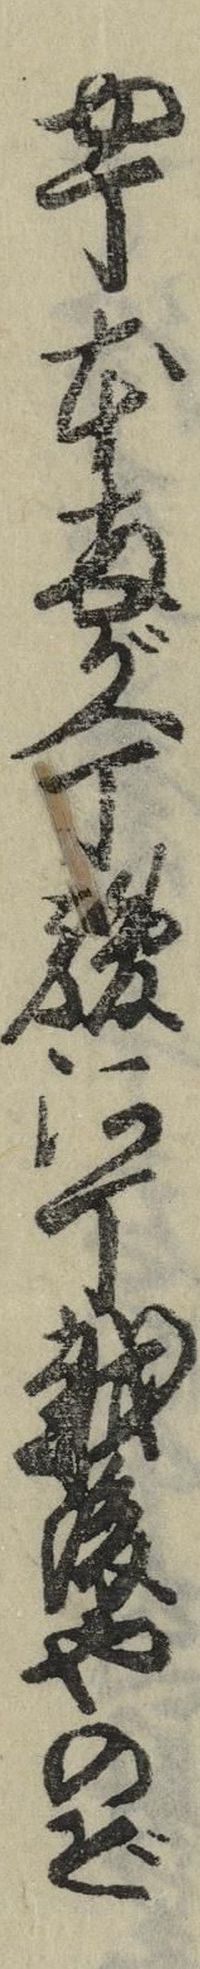や丁本両がへ丁駿河丁越後やのど
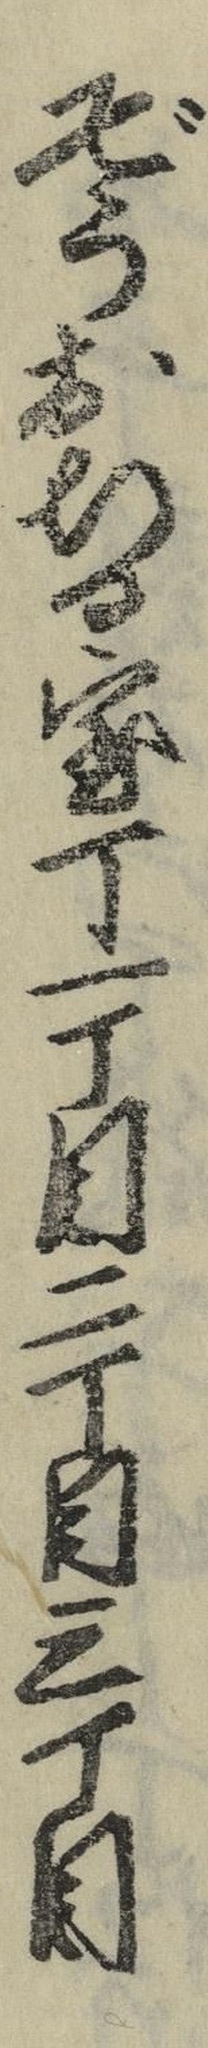ぞうおちる宝丁一丁目二丁目三丁目
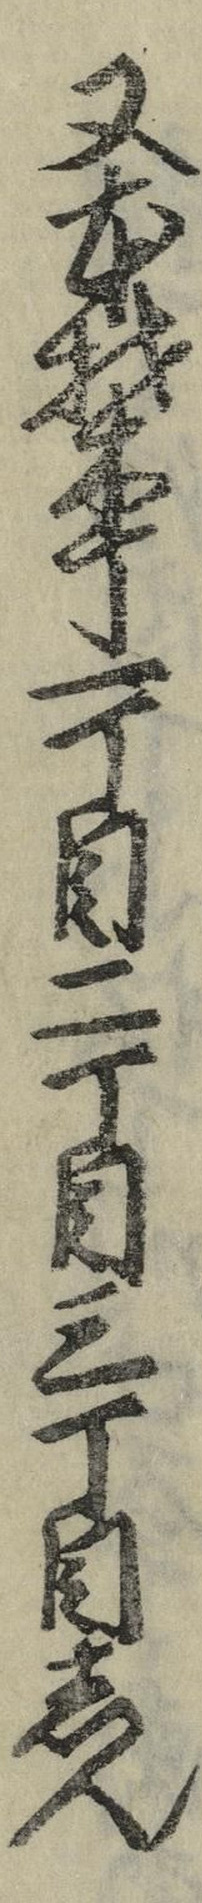又本材木丁一丁目二丁目三丁目しん
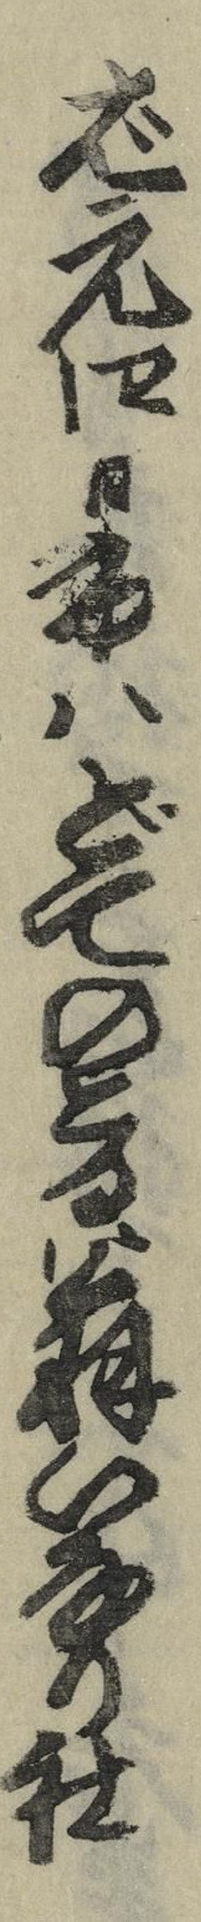ば元四日市はどてのこる翁いなり社

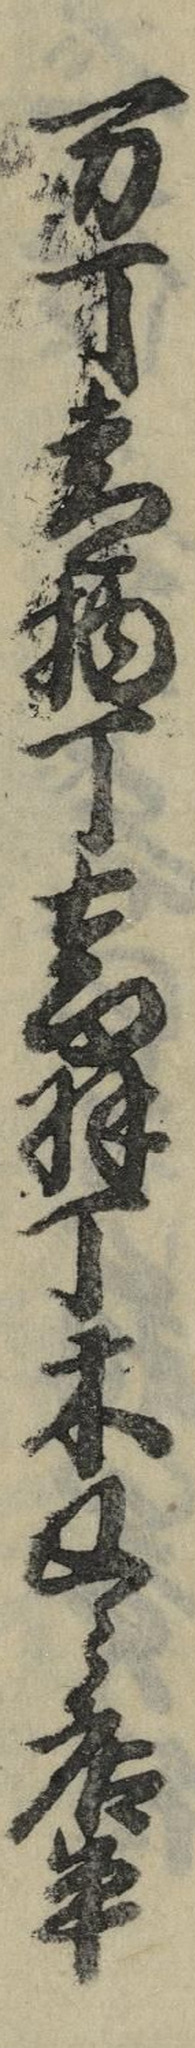万丁青物丁音羽丁木具店平
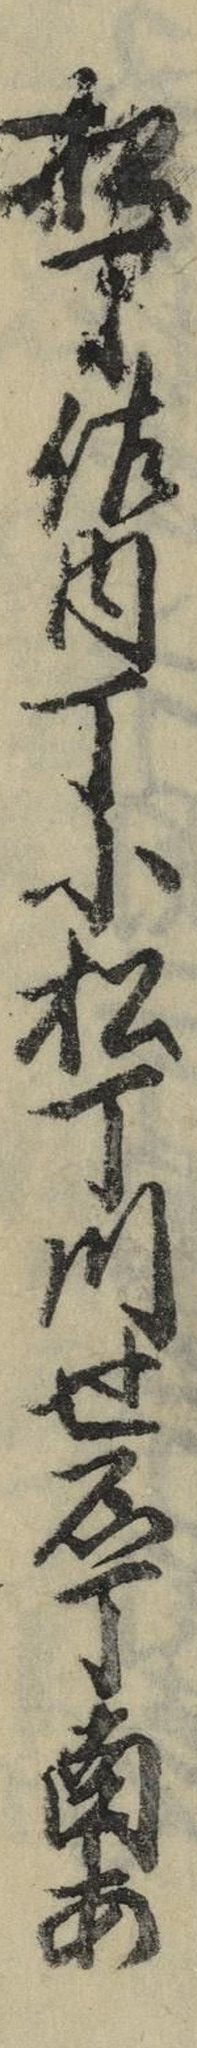松丁佐内丁小松丁川せ石丁南あ
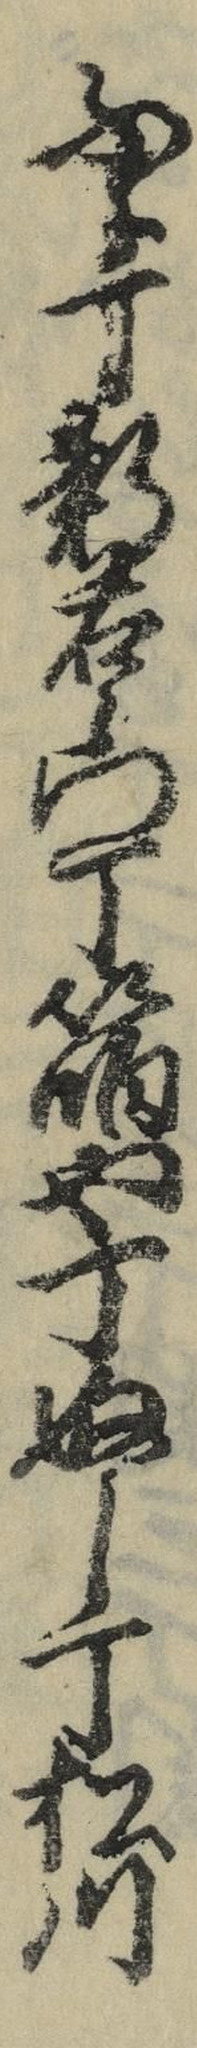ふら丁新右衛門丁箱や丁ぬし丁松川
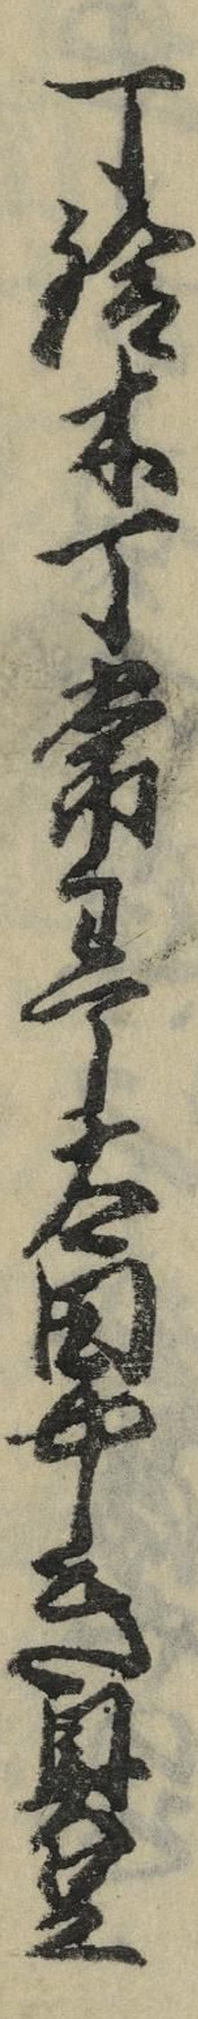丁鈴木丁常わ丁太田やしき具足
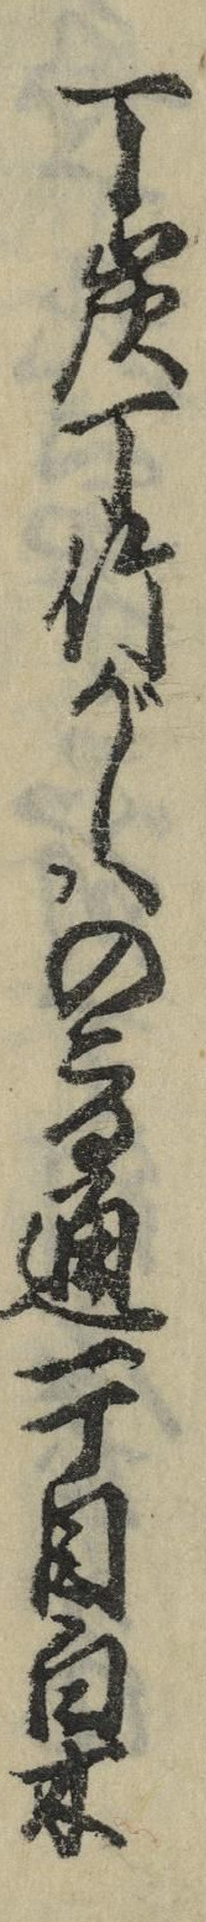丁炭丁竹がしハのこる通一丁目白木
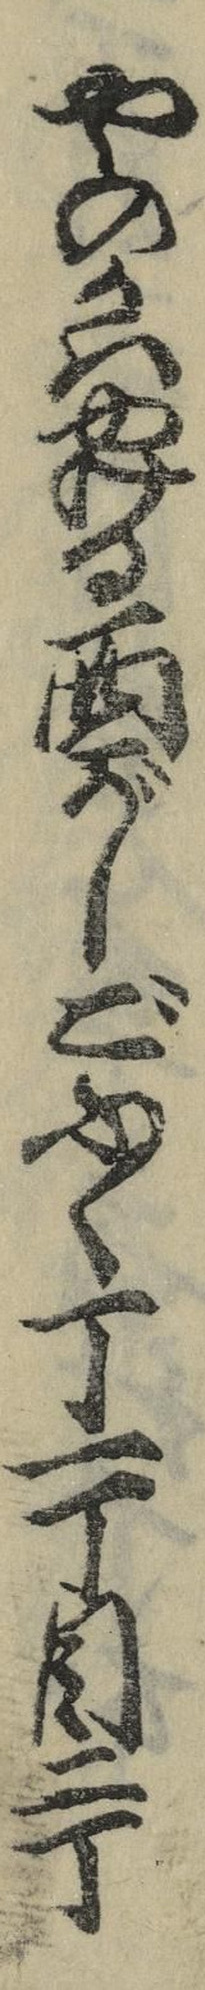やのかハやける西がしごふく丁一丁目二丁
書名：大江戸焼場所明細之写　附出火方角画圖　戊午安政五年十一月十五日
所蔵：東京大学地震研究所図書室 Earthquake Research Institute Library, The University of Tokyo, JAPAN
